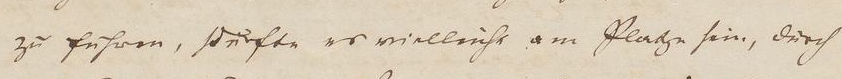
zu führen, dürfte es vielleicht am Platze sein, durch
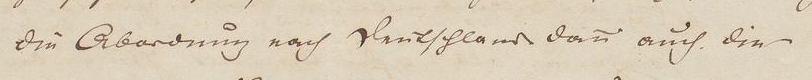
die Abordnung nach Deutschland dann auch die
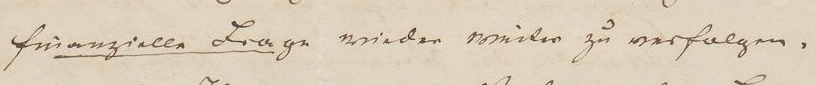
finanzielle Frage wieder weiter zu verfolgen.
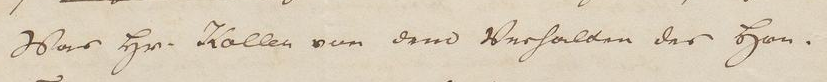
Was Hr. Koller von dem Verhalten des Hrn.
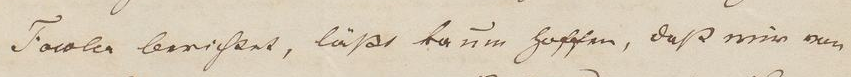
Fowler berichtet, läßt kaum hoffen, daß wir von
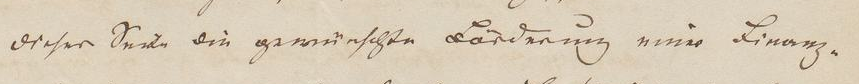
dieser Seite die gewünschte Förderung einer Finanz-
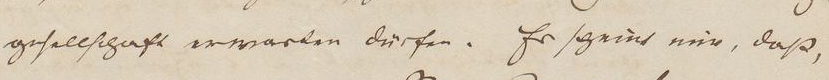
gesellschaft erwarten dürfen. Es scheint mir, daß,
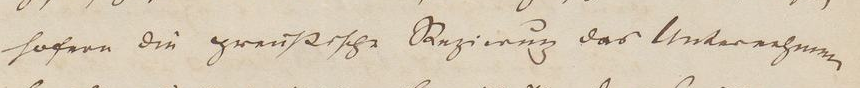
sofern die preußische Regierung das Unternehmen
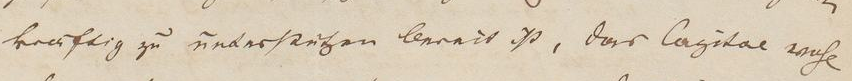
kräftig zu unterstützen bereit ist, das Capital wohl
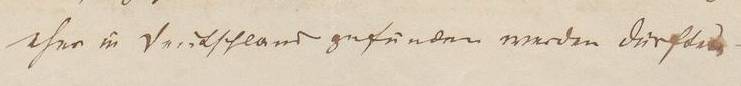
eher in Deutschland gefunden werden dürfte. –
